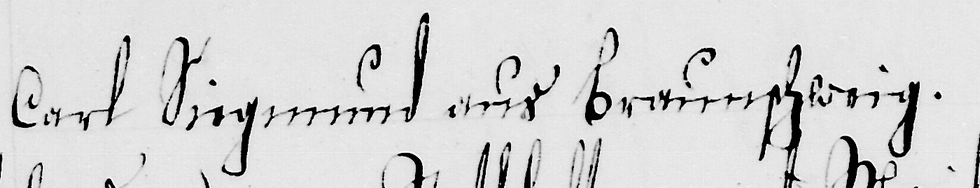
Carl Siegmund aus Braunschweig.
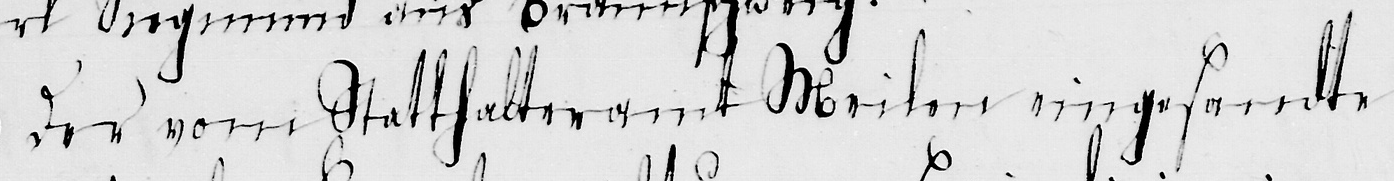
Der vom Statthalteramt Meilen eingesandte
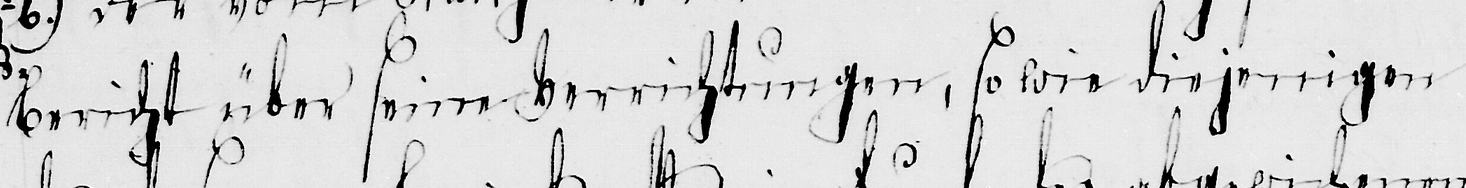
Bericht über seine Verrichtungen, so wie diejenigen
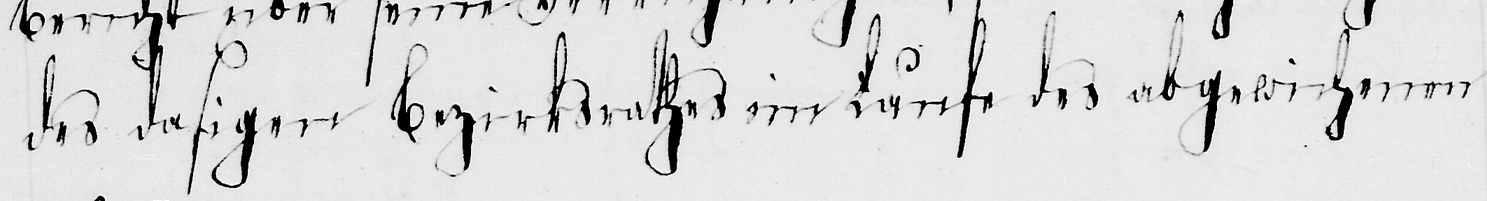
des dasigen Bezirksrathes im Laufe des abgewichenen
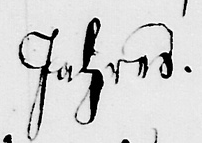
Jahres.
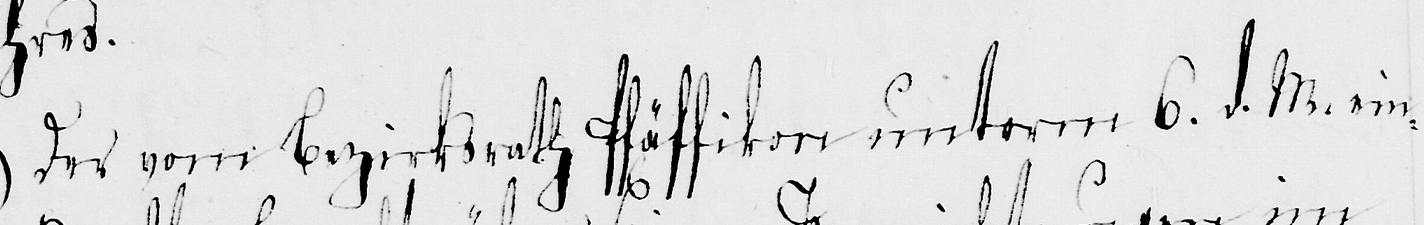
Der vom Bezirksrath Pfäffikon unterm 6. d. M. ein¬
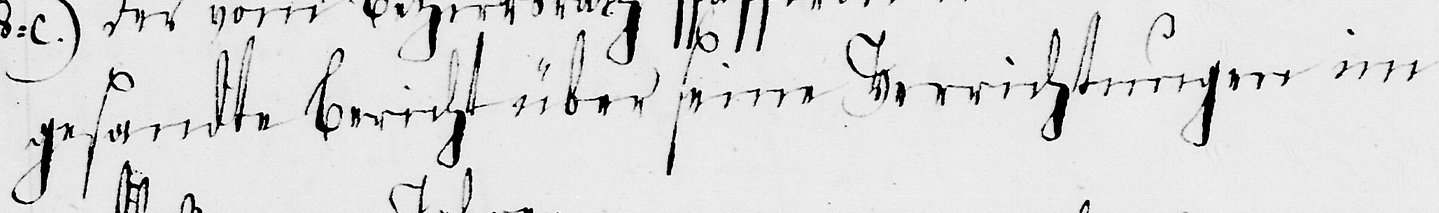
gesandte Bericht über seine Verrichtungen im
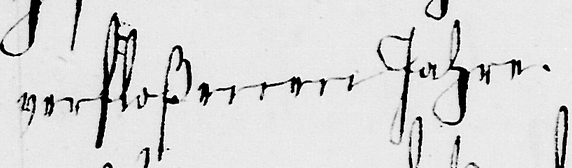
verflossenen Jahre.
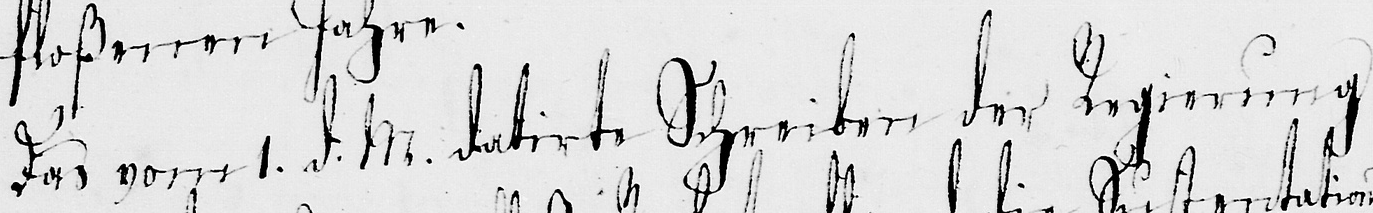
Das vom 1. d. M. datirte Schreiben der Regierung
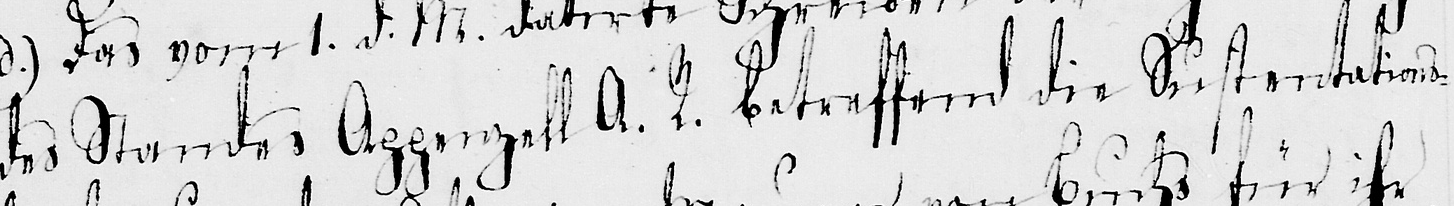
des Standes Appenzell A. R. betreffend die Sustentation¬
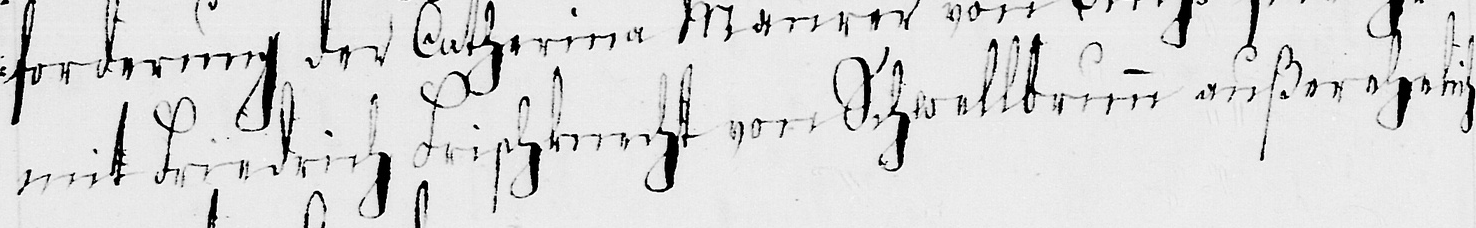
mit Friedrich Frischknecht von Schwellbrunn außereheli¬
